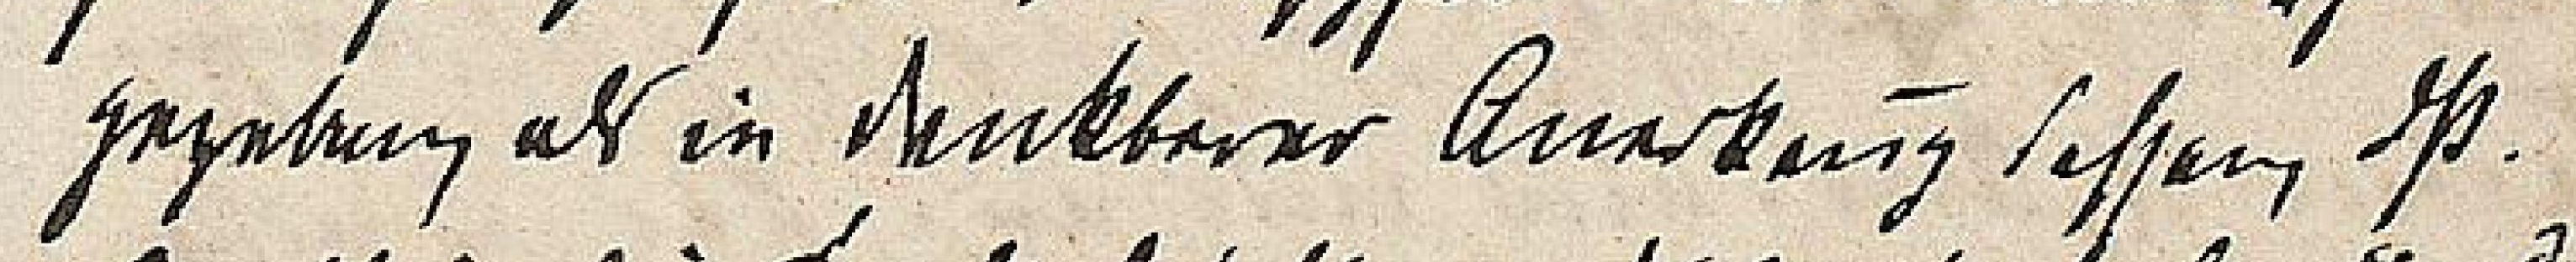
gegeben, als in dankbarer Anerkennung dessen, daß.
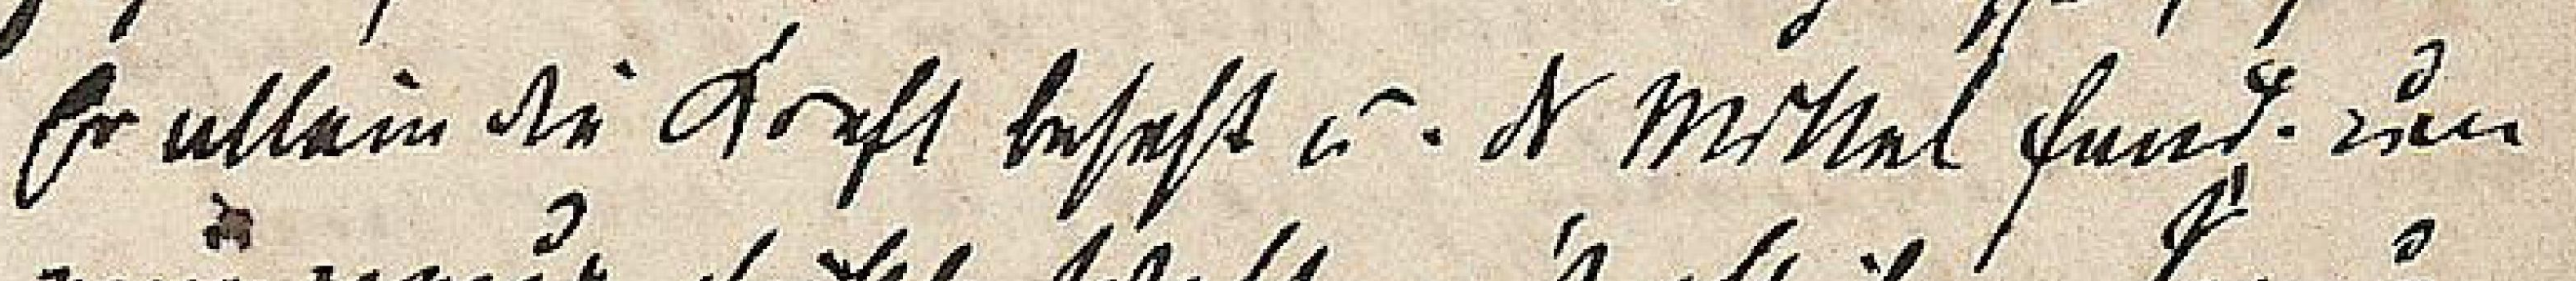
Er allein die Kraft besest u. ds Mittel fand. um
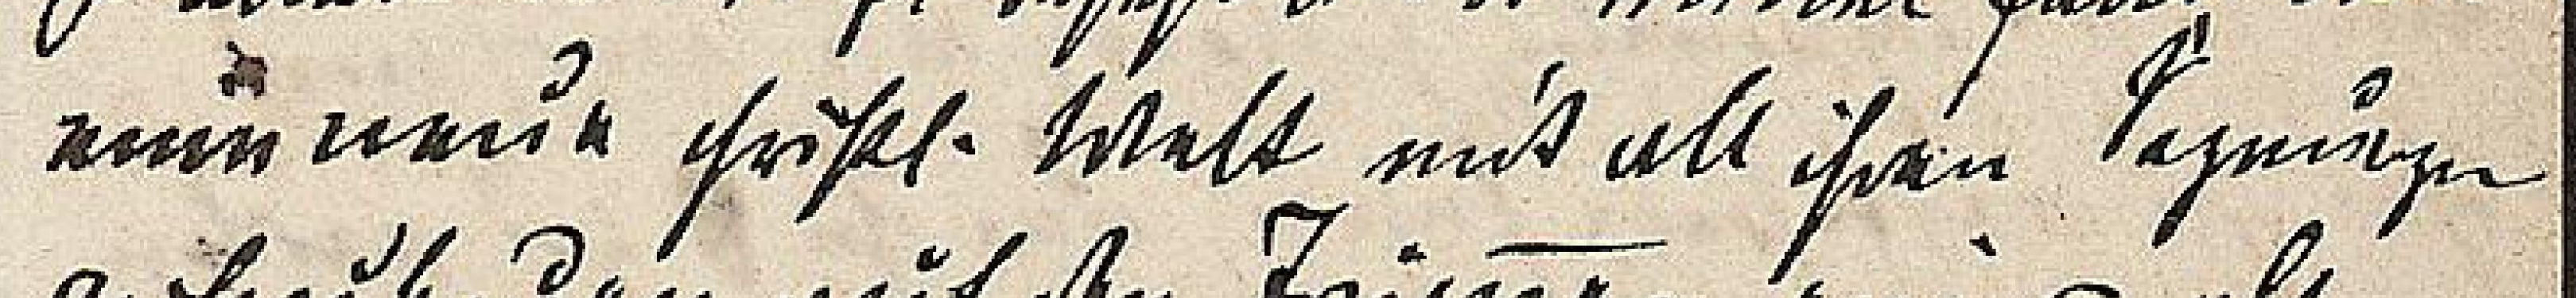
eine neue christl. Welt mit all ihren Segnungen
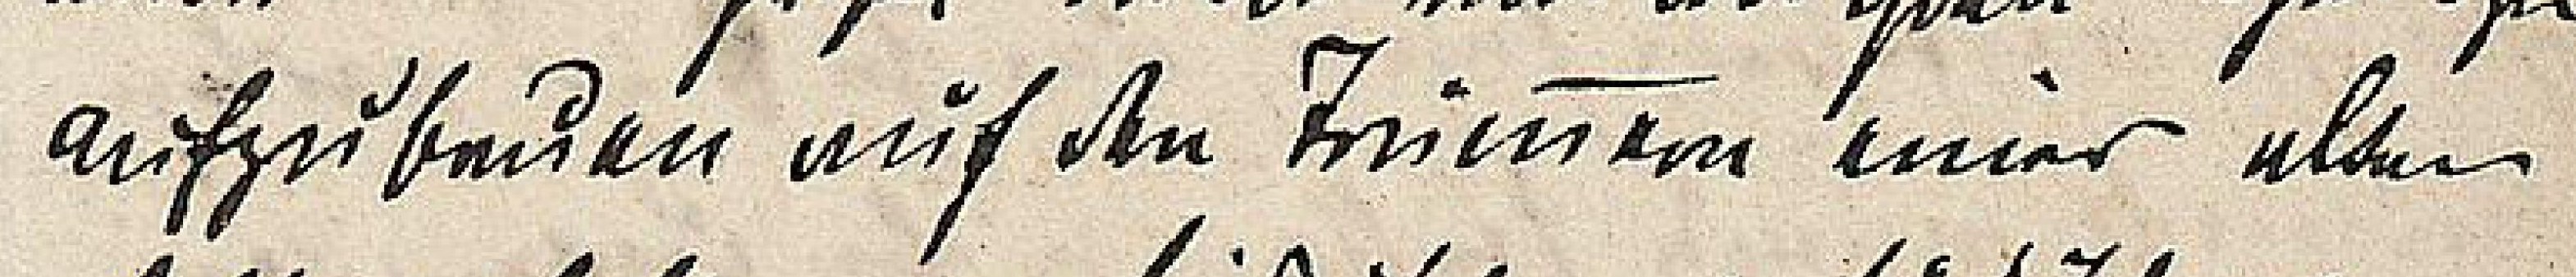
aufzubauen auf den Trümern einer allen
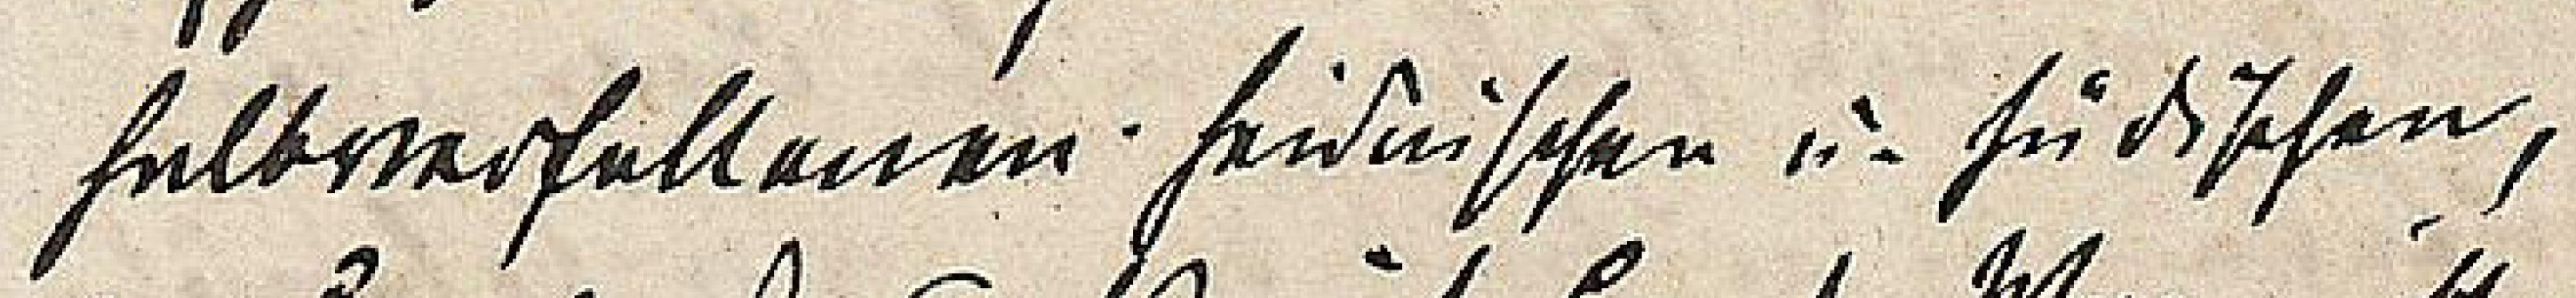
halbverfallenen. heidnischen u. jüdischen,
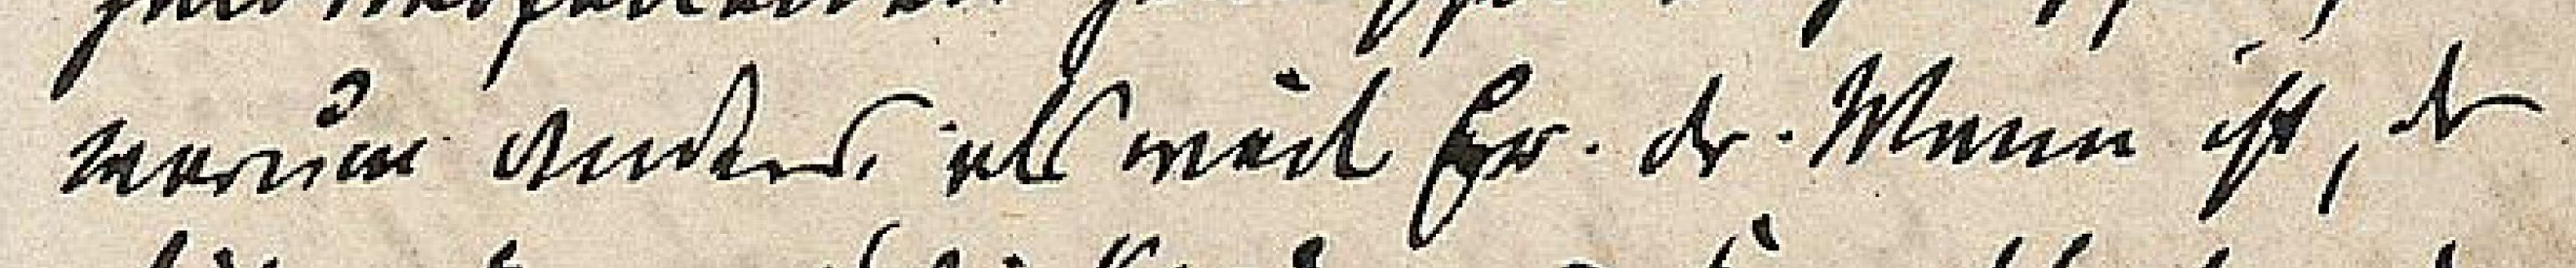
warum anders, als weil Er. dr. Mann ist, der
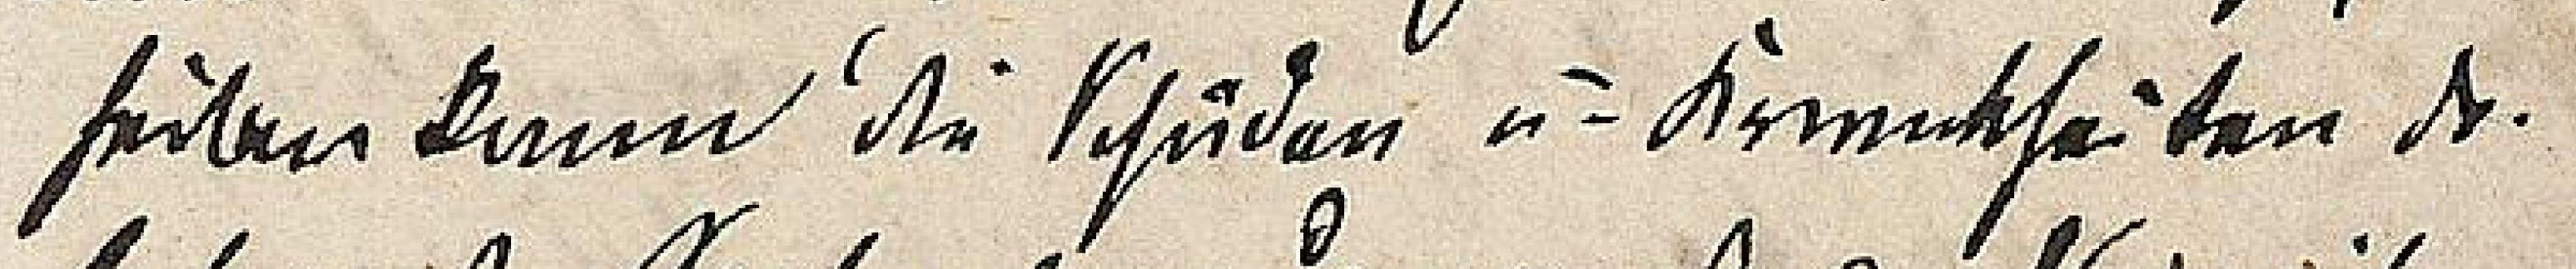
heilen kann die Schäden u. Krankheiten dr.
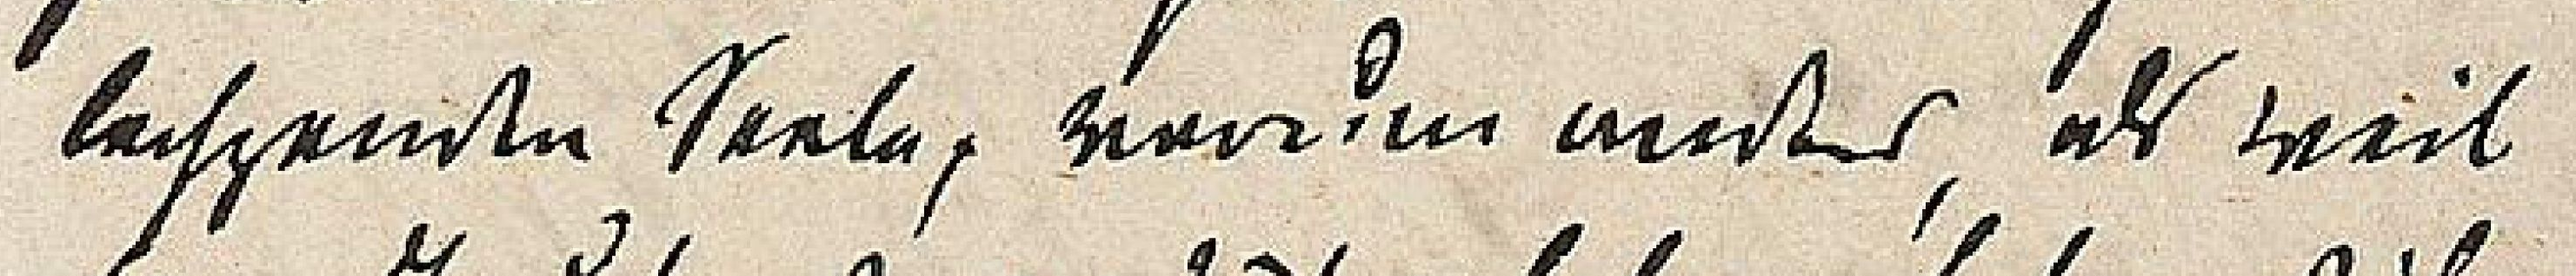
lechzenden Seele, warum anders, als weil
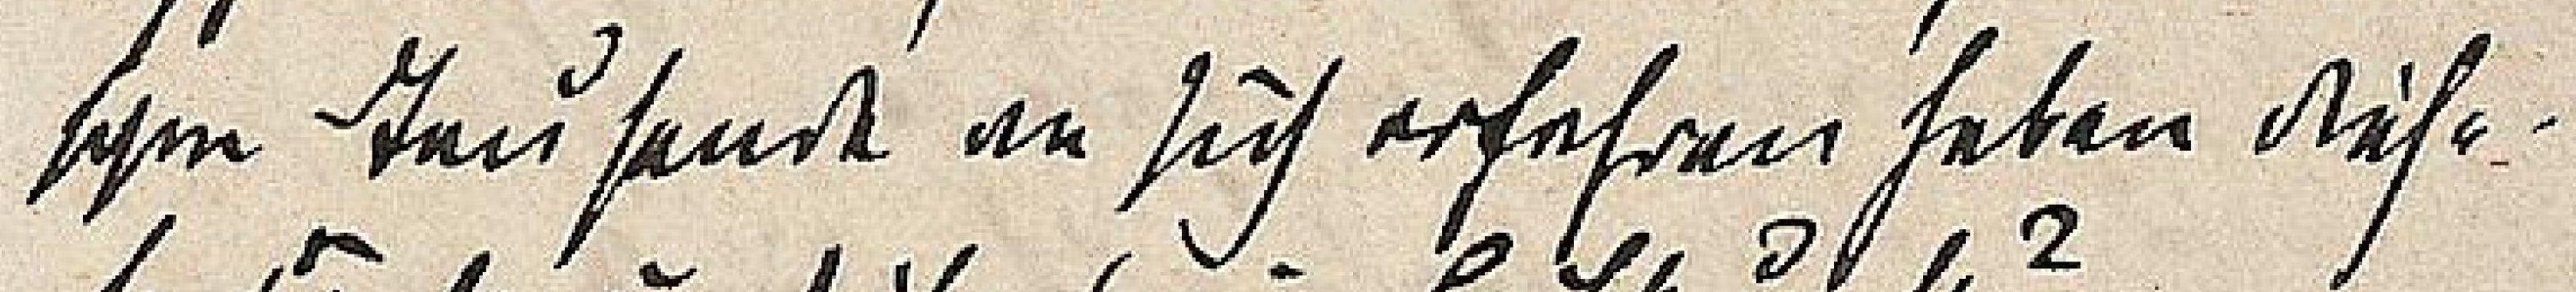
schon Tausende an sich erfahren haben diese.
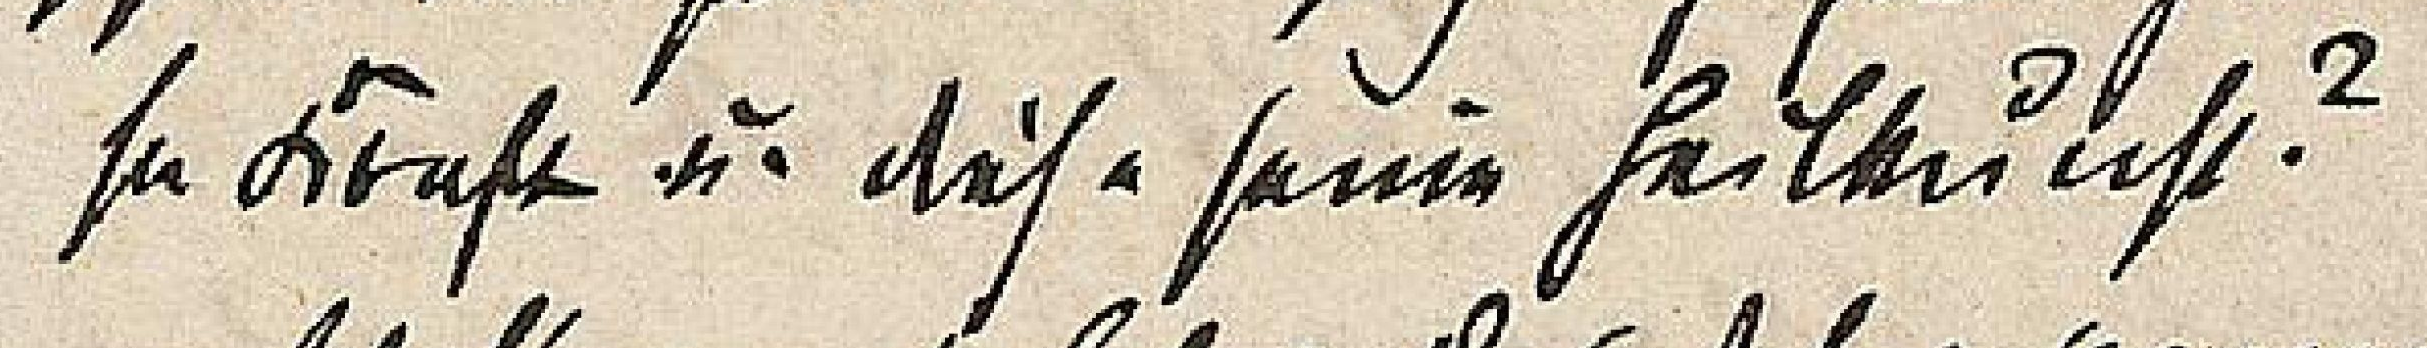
sn Kraft. u. diese seine Heilkunst?
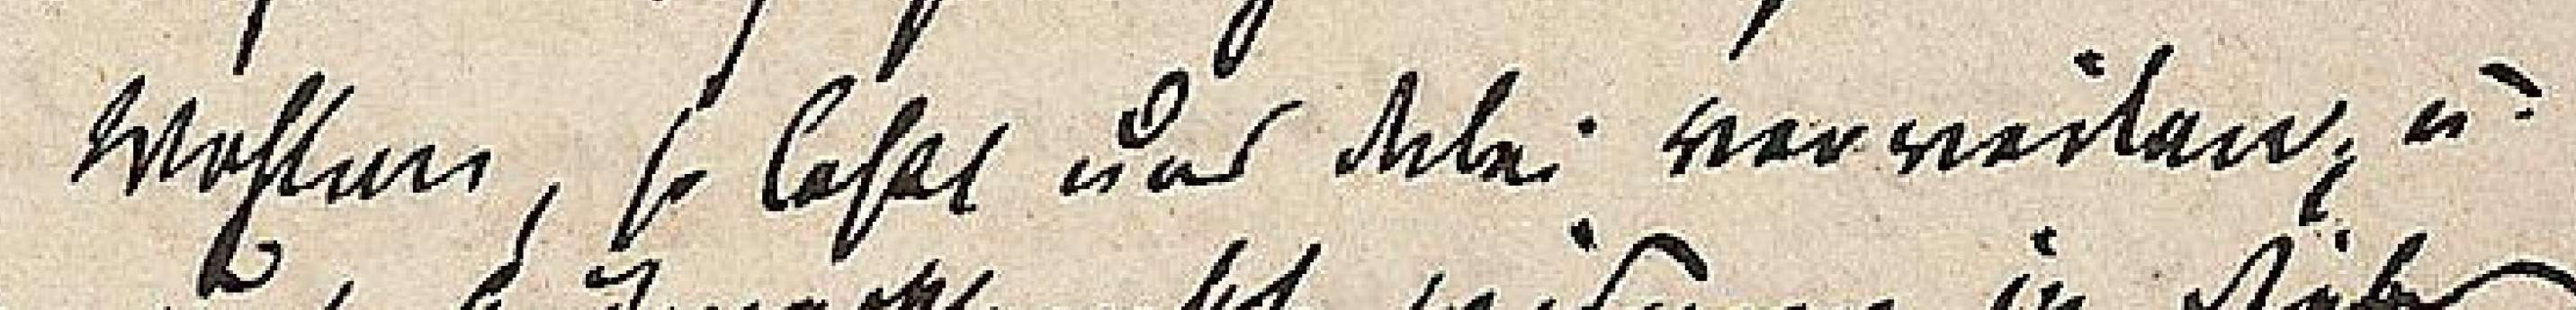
Wohlan, so laßt uns dabei verweilen, u.
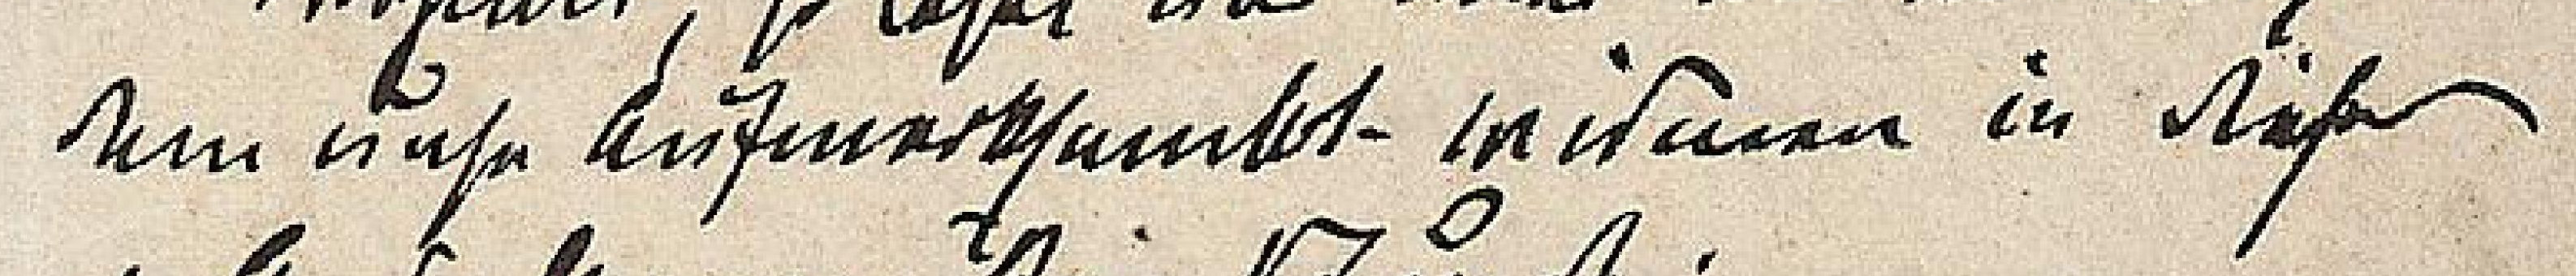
dem unse Aufmerksamkt. widmen in dieser
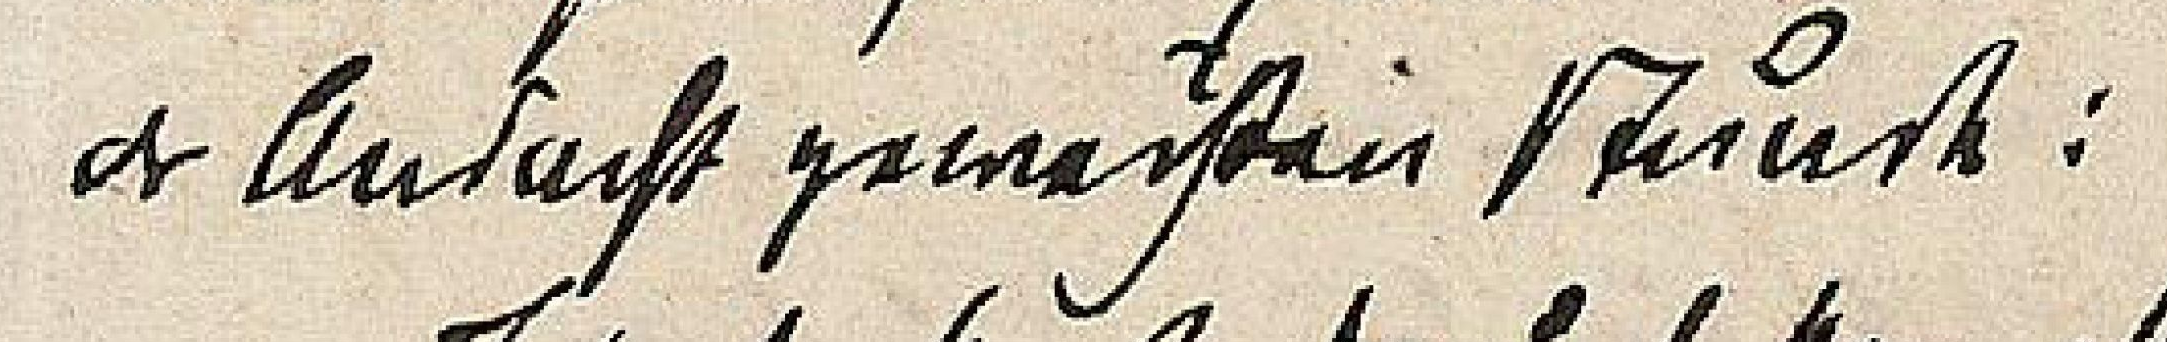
dr Andacht geweihten Stunde:
